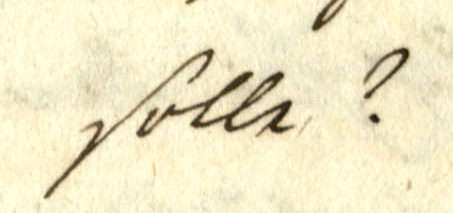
solle?
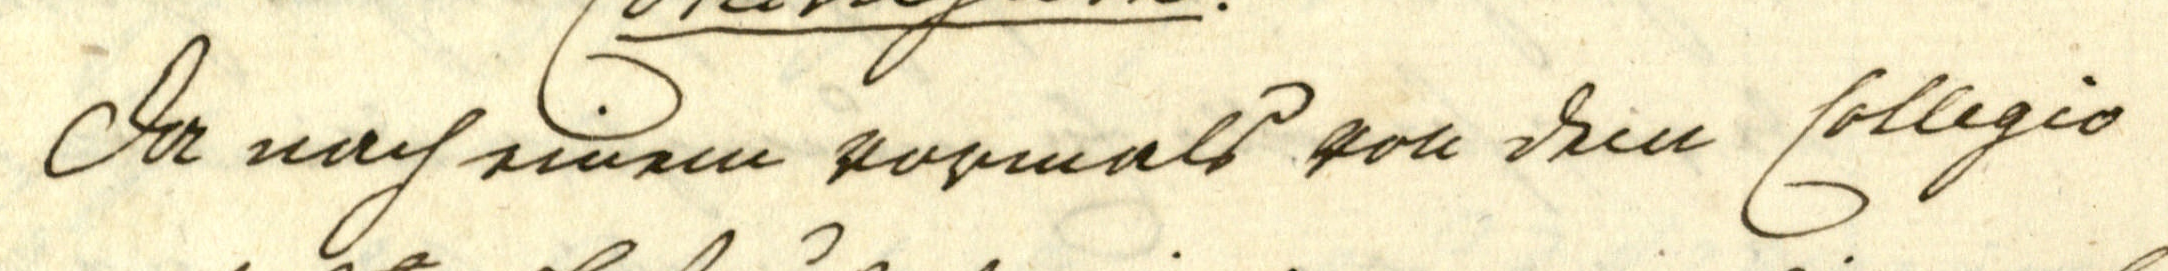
Da nach einem vormals von dem Collegio
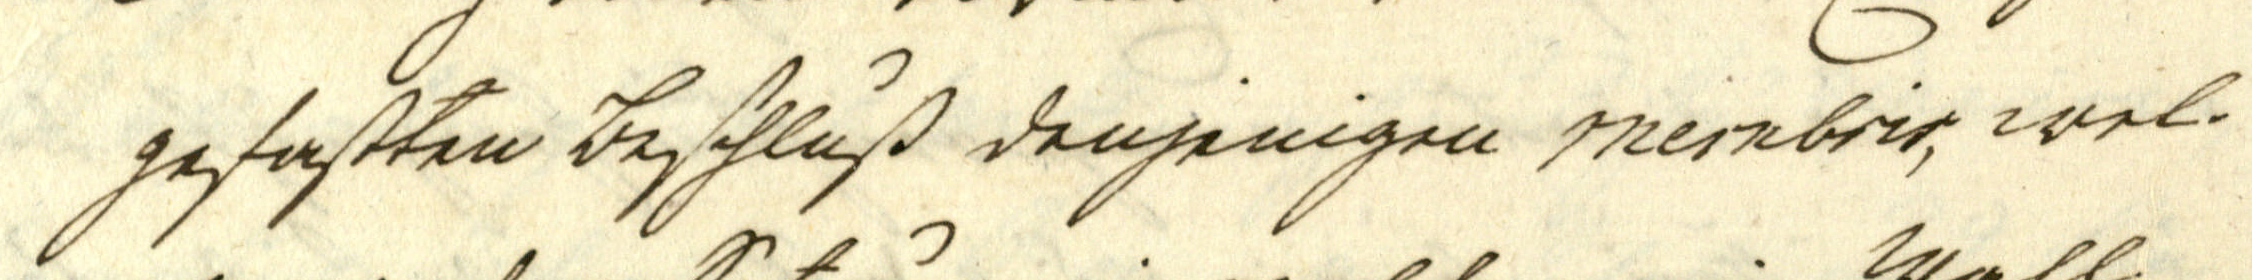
gefaßten Beschluß denjenigen membris, wel¬
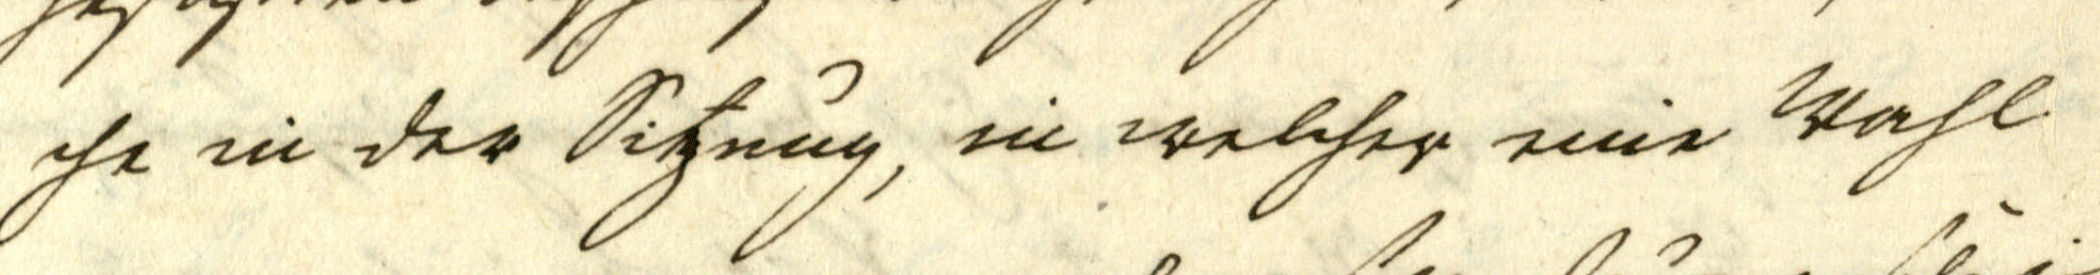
che in der Sitzung, in welcher eine Wahl
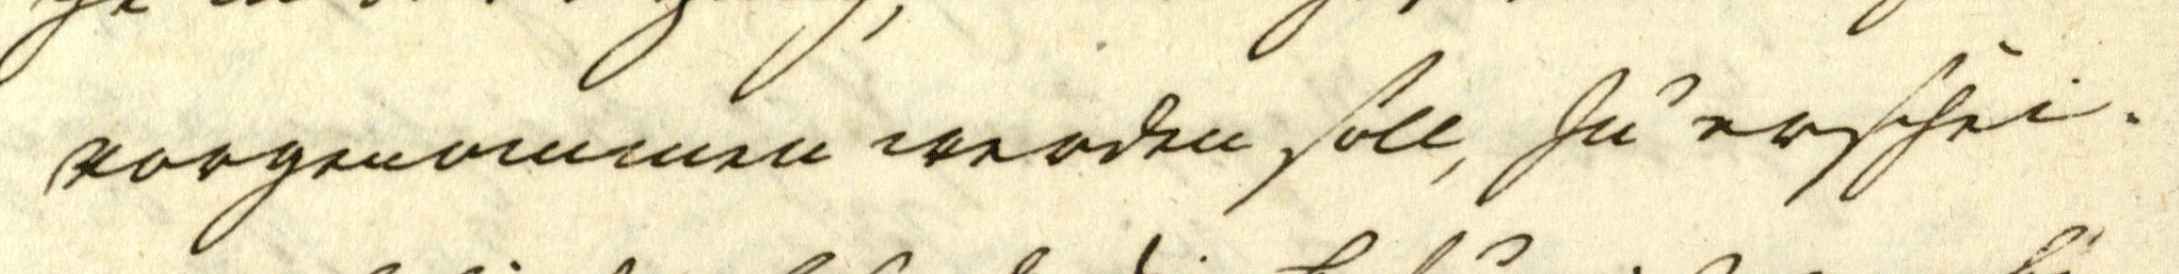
vorgenommen werden soll, zu erschei-
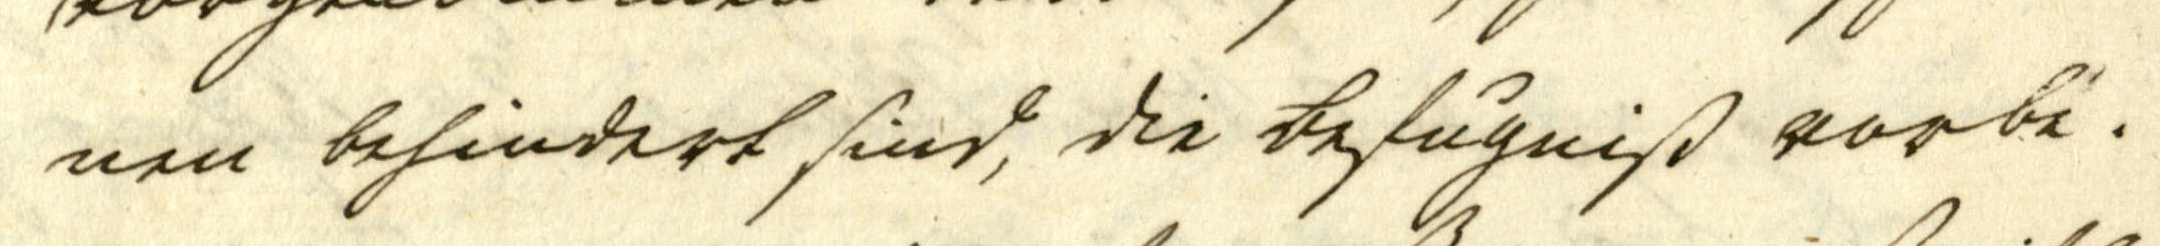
nen behindert sind, die Befugniß vorbe¬
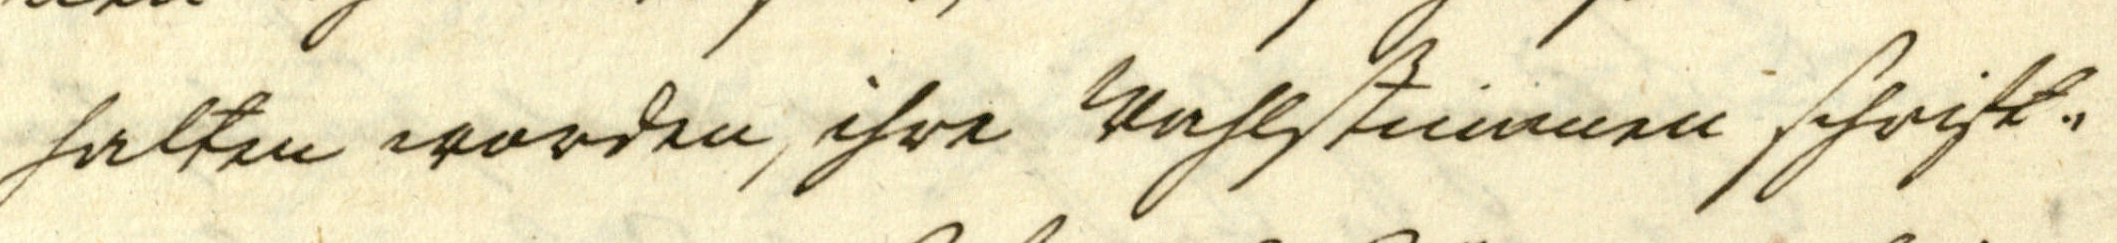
halten worden, ihre Wahlstimmen schrift¬
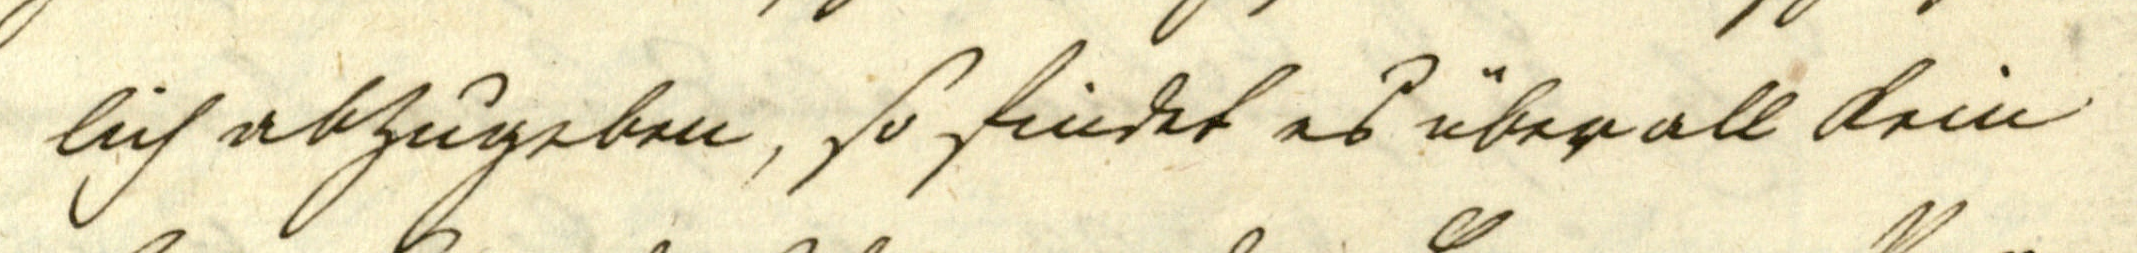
lich abzugeben, so findet es überall kein
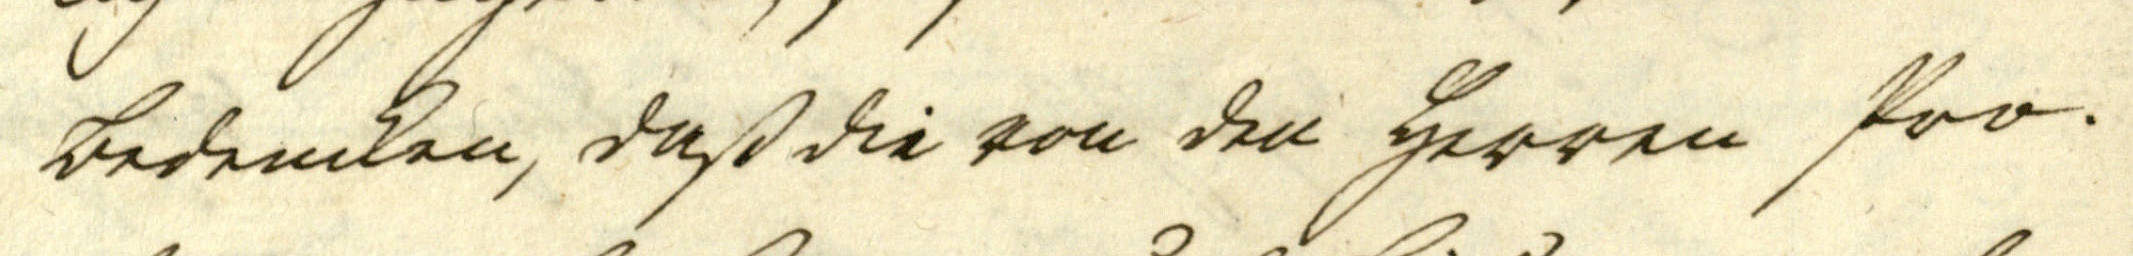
Bedencken, daß die von den Herren Pro¬
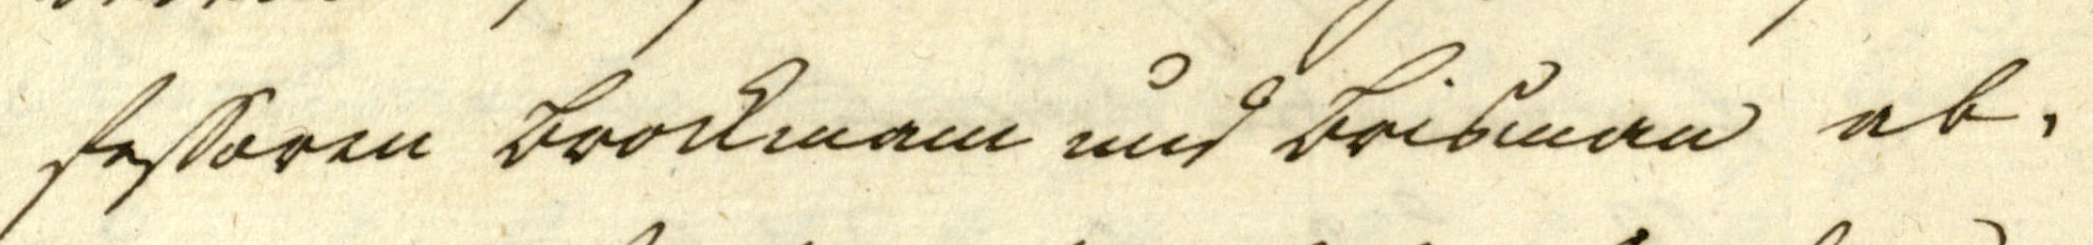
fessoren Brockmann und Brisman ab¬
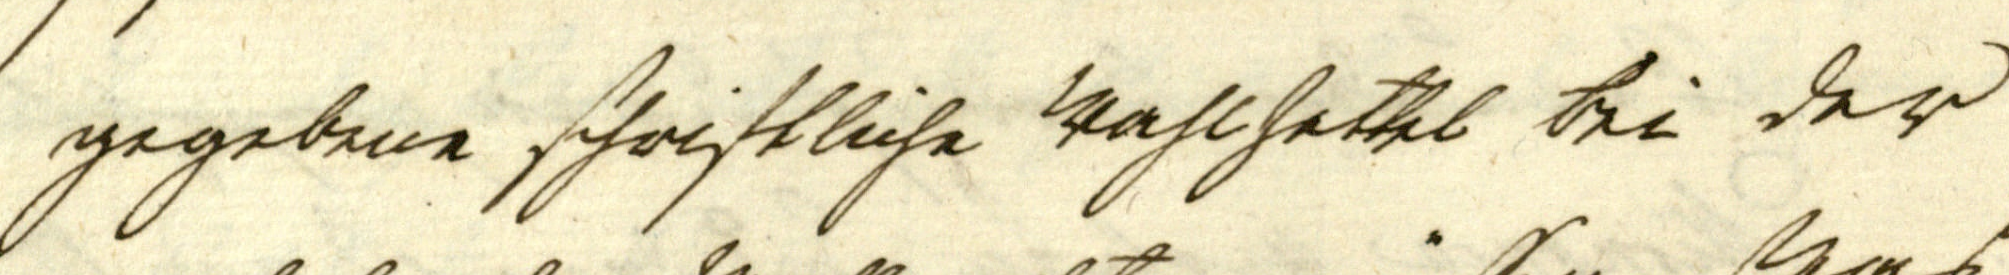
gegebene schriftliche Wahlzettel bei der
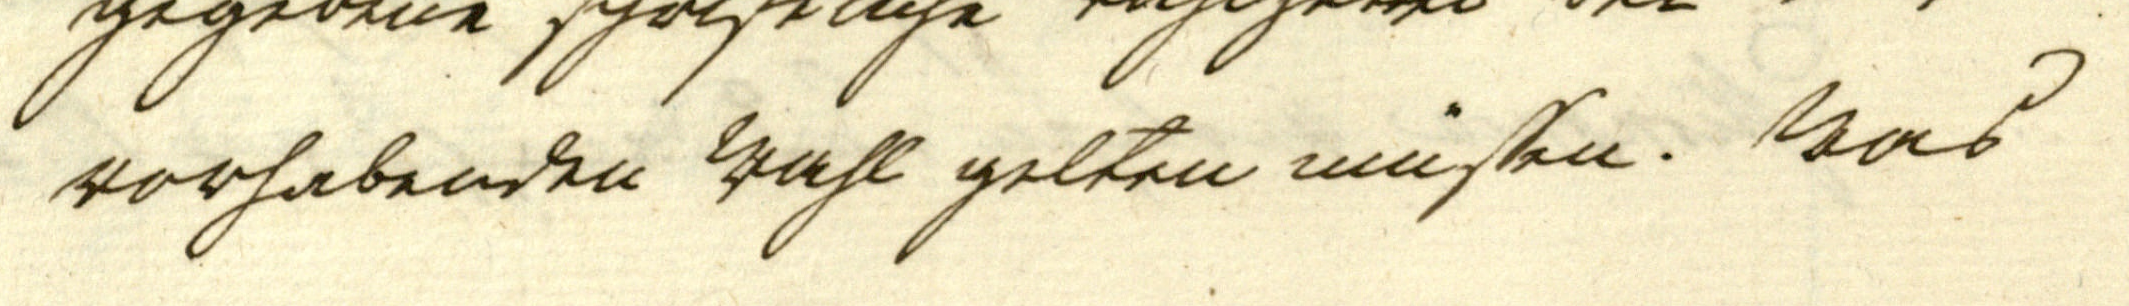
vorhabenden Wahl gelten müssen. Was
